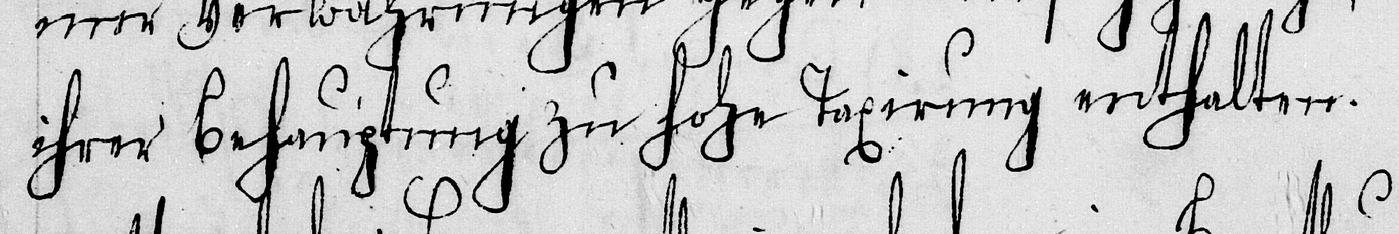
ihrer Behauptung zu hohe Taxirung enthalten.
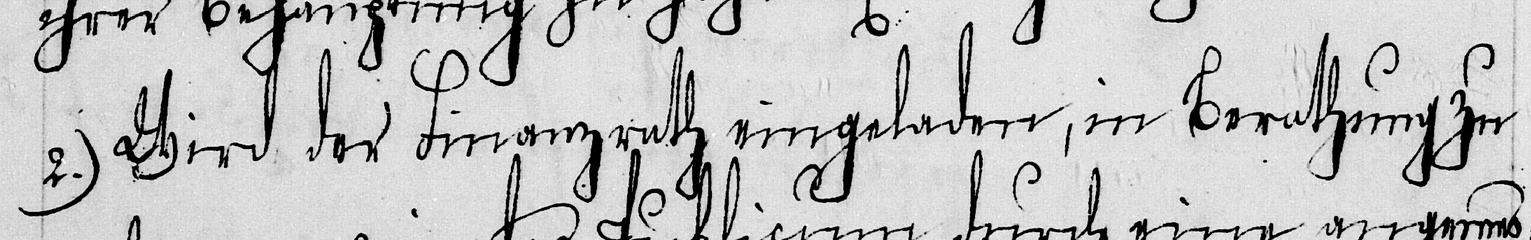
2.) Wird der Finanzrath eingeladen, in Berathung zu
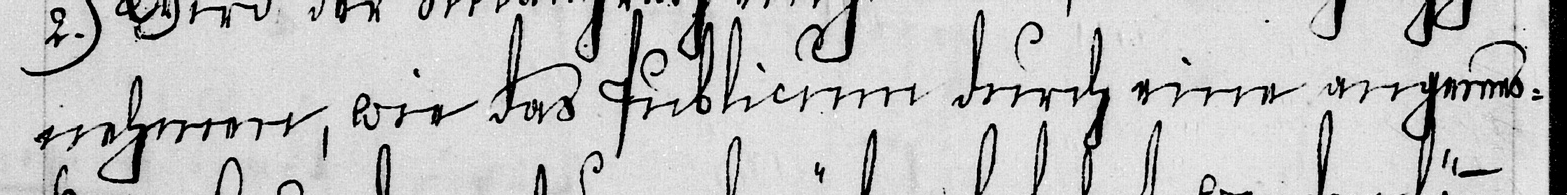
nehmen, wie das Publicum durch eine angemeß¬
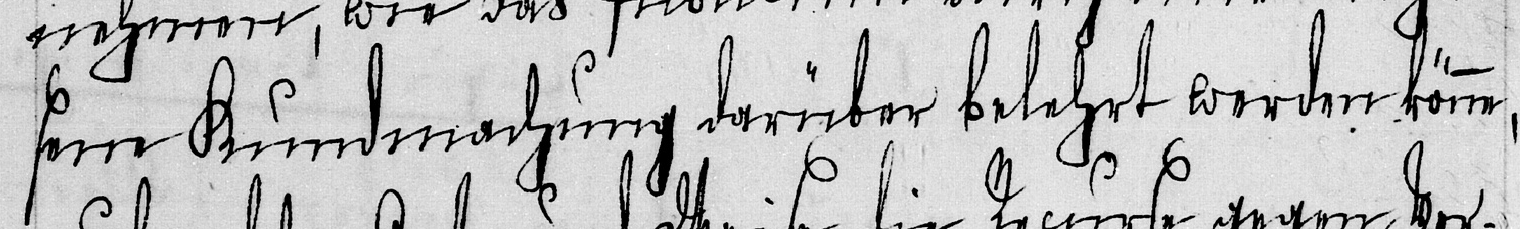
ene Kundmachung darüber belehrt werden kön¬
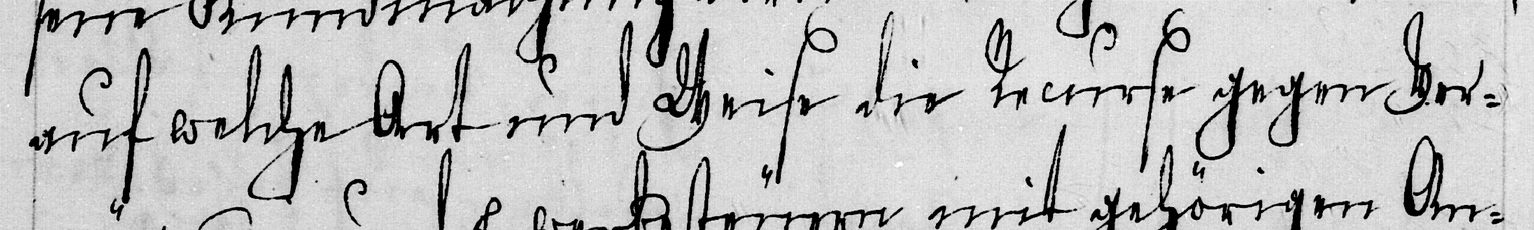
auf welche Art und Weise die Recurse gegen Ver¬
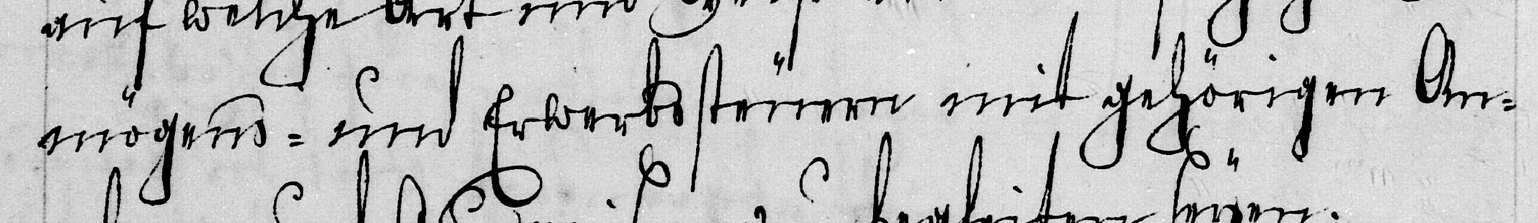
mögens- und Erwerbssteuern mit gehörigen An¬
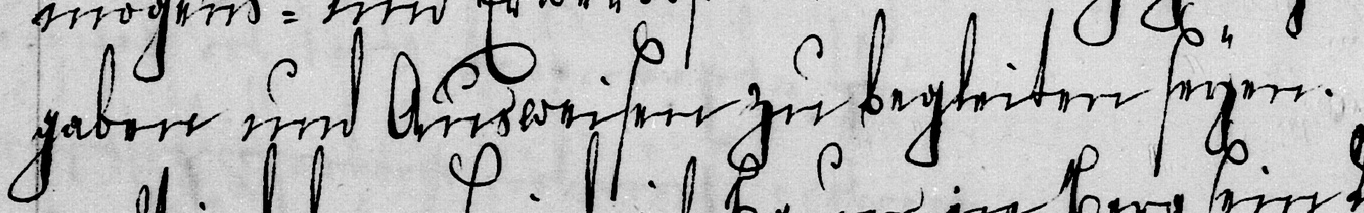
gaben und Ausweisen zu begleiten seyen.
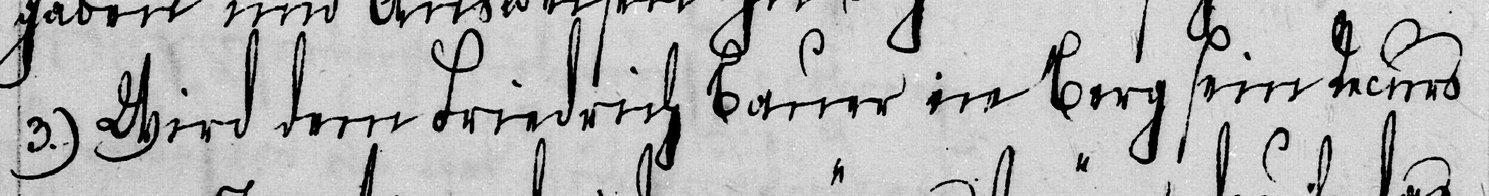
3.) Wird dem Friedrich Bauer in Berg sein Recurs
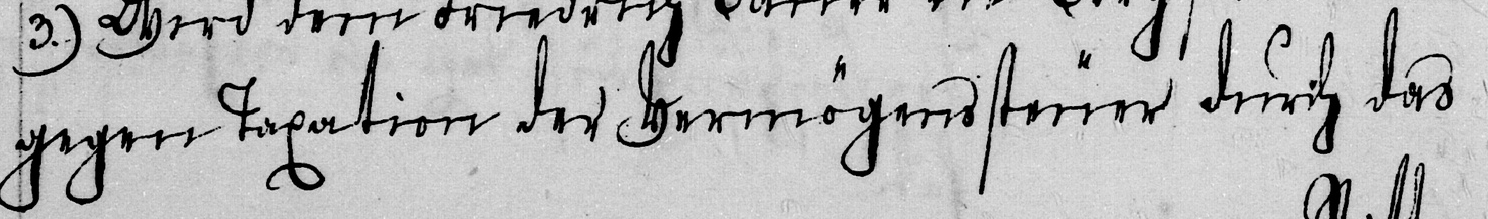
gegen Taxation der Vermögenssteuer durch das
